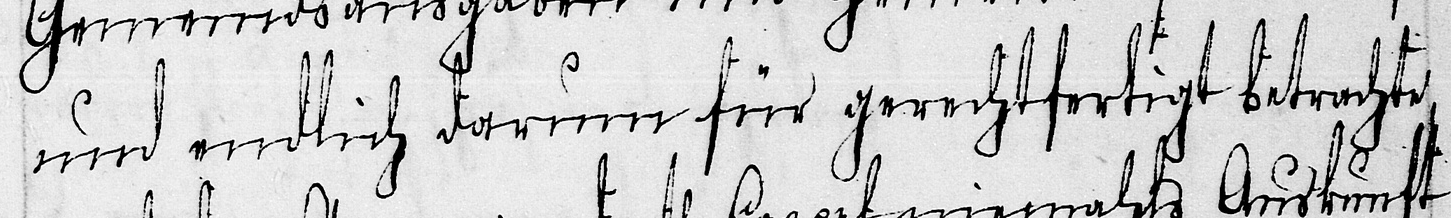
und endlich darum für gerechtfertigt betrachte,
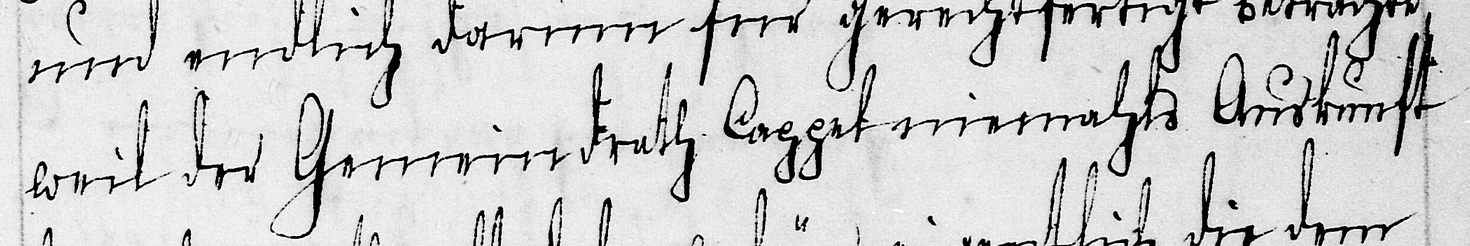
weil der Gemeindrath Cappel niehmals Auskunft
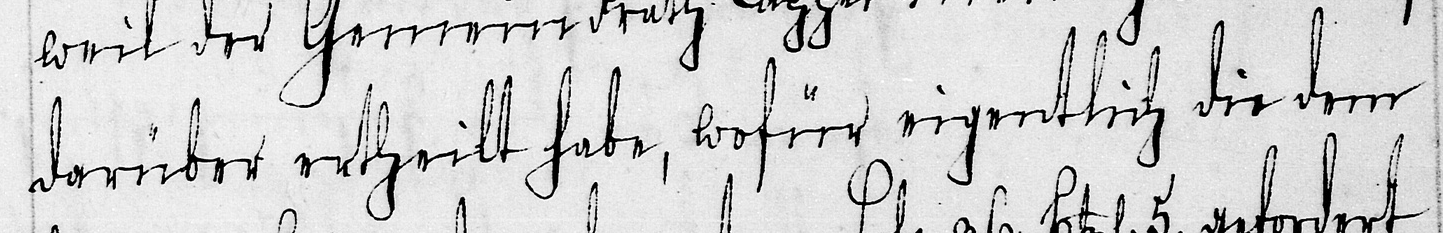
darüber ertheilt habe, wofür eigentlich die dem
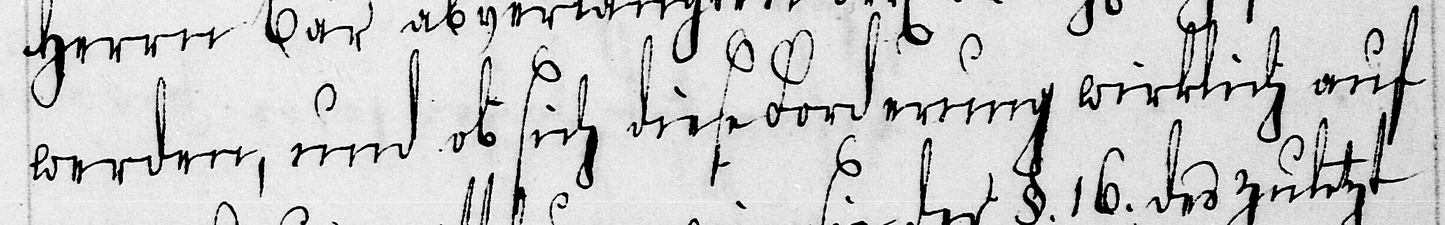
werden, und ob sich diese Forderung wirklich auf
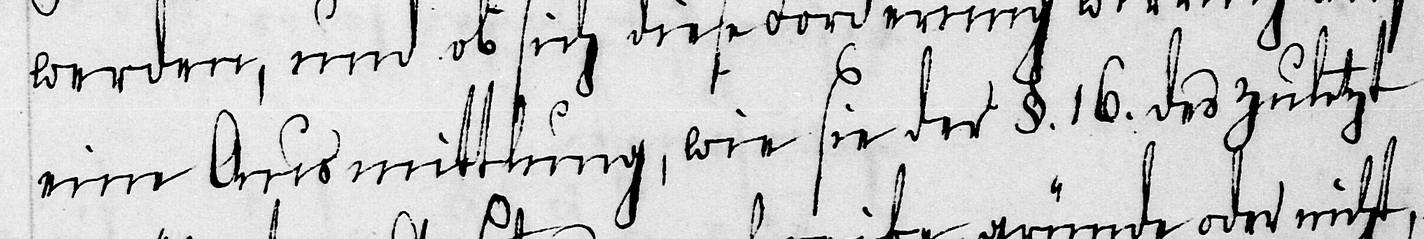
eine Ausmittlung, wie sie der §. 16. des zuletzt
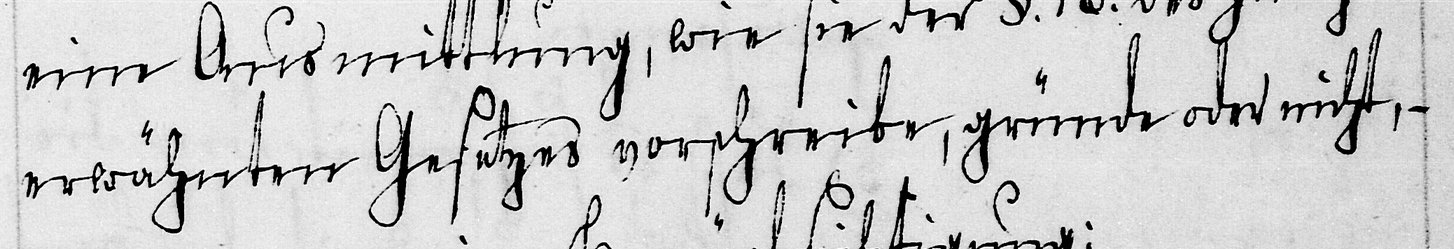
erwähnten Gesetzes vorschreibe, gründe oder nicht, –
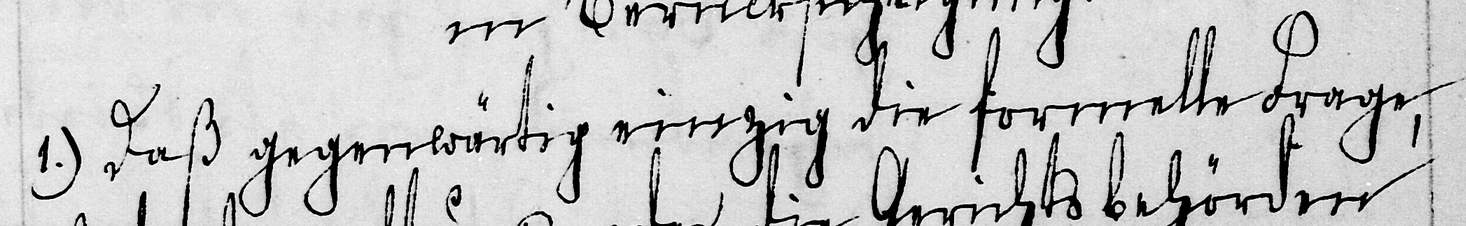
1.) Daß gegenwärtig einzig die formelle Frage,
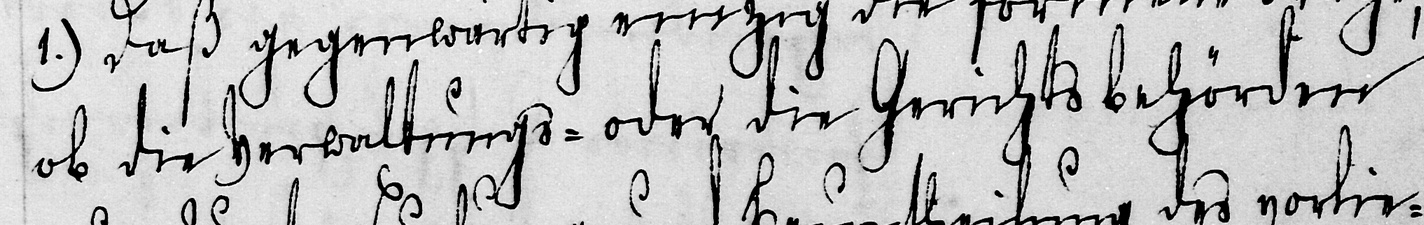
ob die Verwaltungs- oder die Gerichtsbehörden
